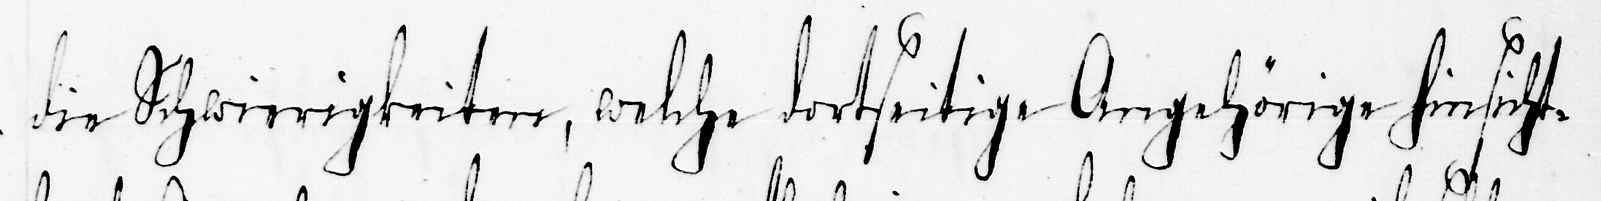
die Schwierigkeiten, welche dortseitige Angehörige hinsicht¬
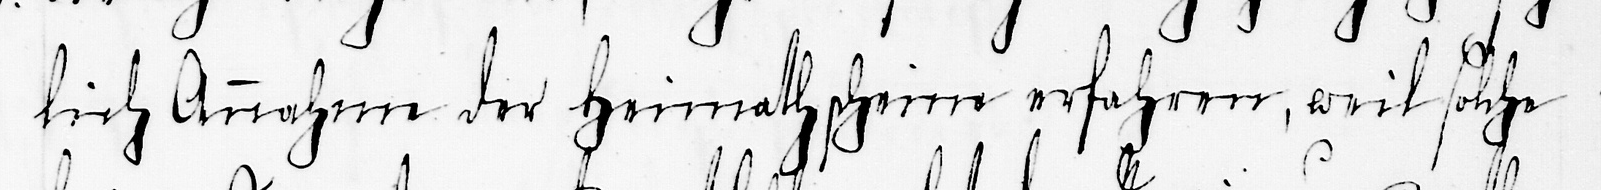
lich Annahme der Heimathscheine erfahren, weil solche
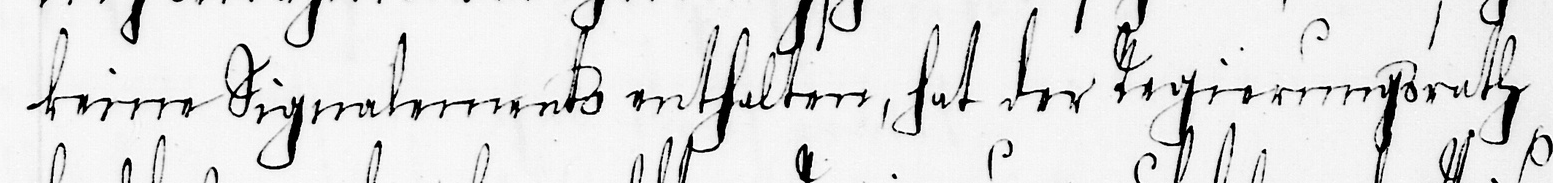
keine Signalements enthalten, hat der Regierungsrath
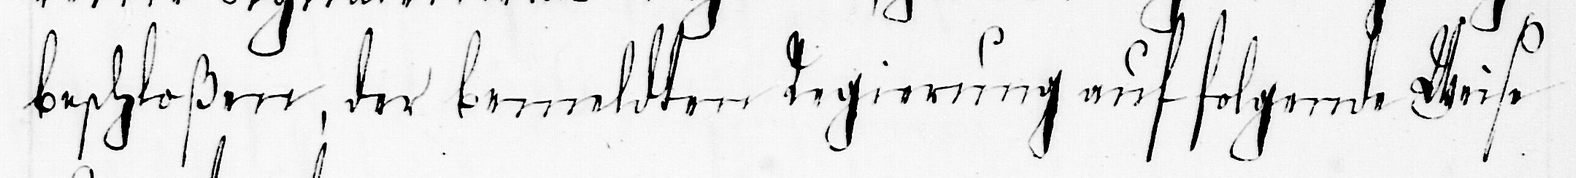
beschloßen, der bemeldten Regierung auf folgende Weise
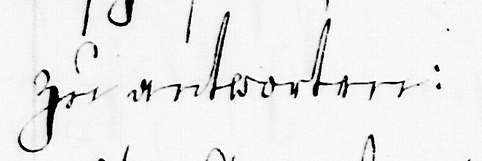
zu antworten:
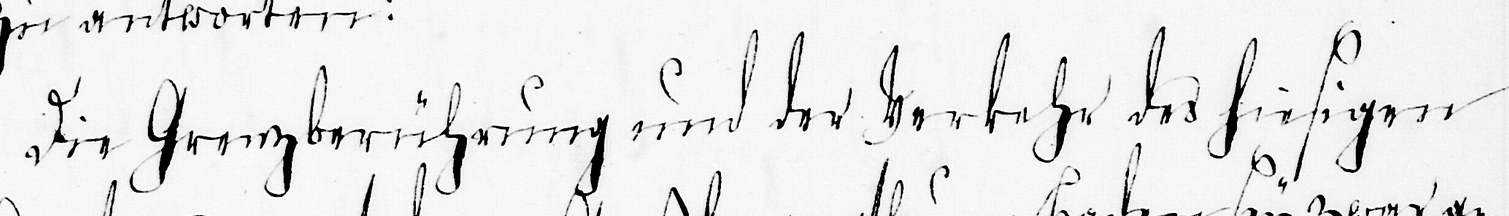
Die Grenzberührung und der Verkehr des hiesigen
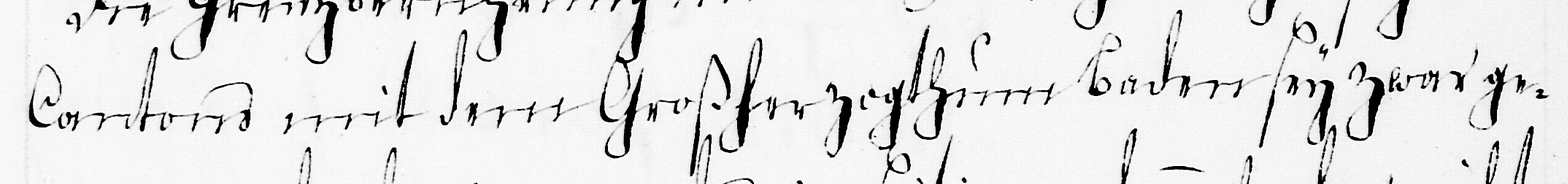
Cantons mit dem Großherzogthum Baden sey zwar ge¬
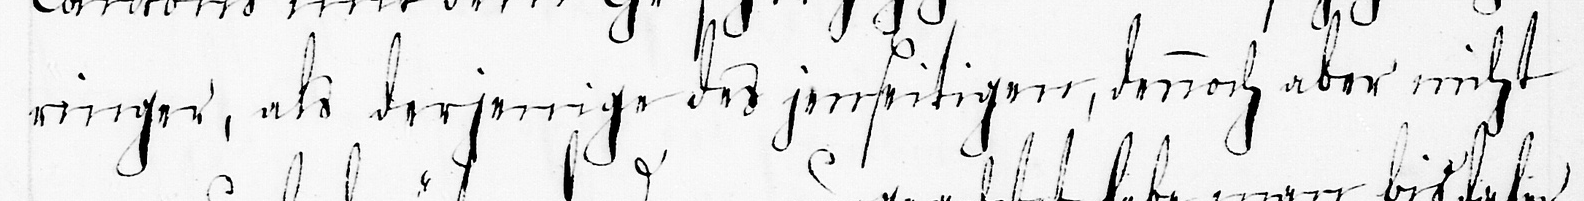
ringer, als derjenige des jenseitigen, dennoch aber nicht
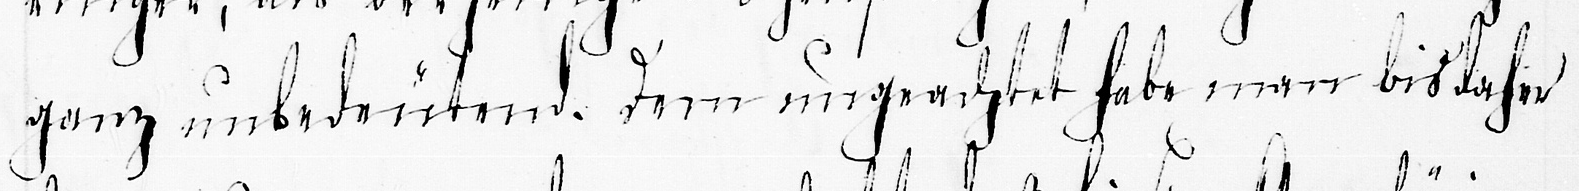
ganz unebdeutend. Dem ungeachtet habe man bis daher
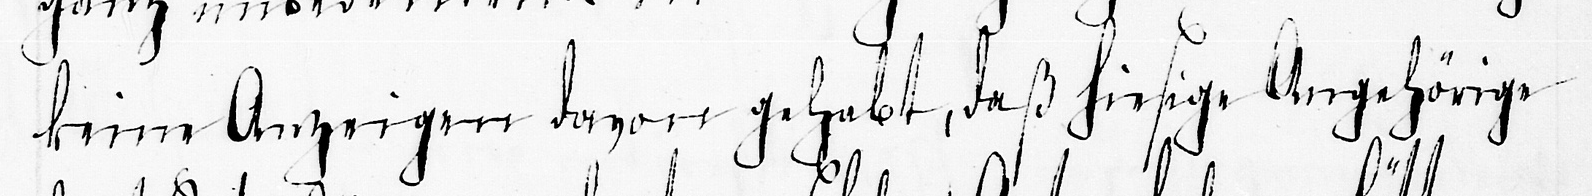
keine Anzeigen davon gehabt, daß hiesige Angehörige
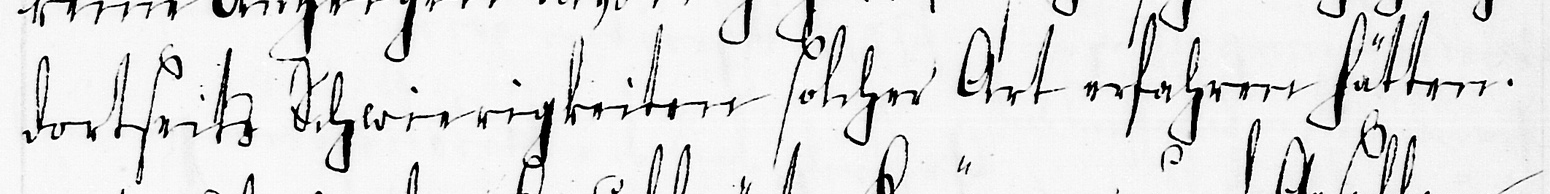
dortseits Schwierigkeiten solcher Art erfahren hätten.
